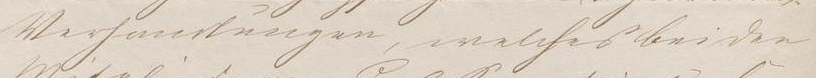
Verhandlungen, welches bei den
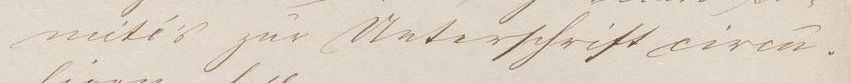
mités zur Unterschrift circu-
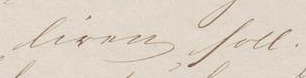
liren soll.
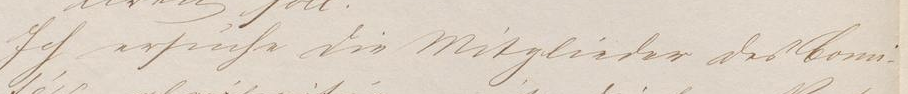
Ich ersuche die Mitglieder des Comi-
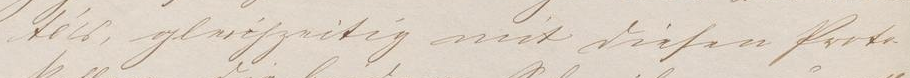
tés, gleichzeitig mit diesen Proto-
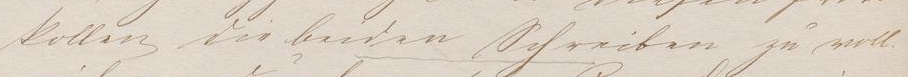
kollen die beiden Schreiben zu voll-
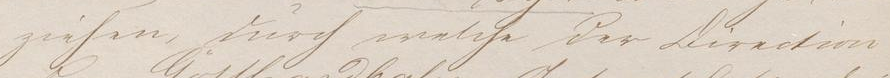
ziehen, durch welche der Direction
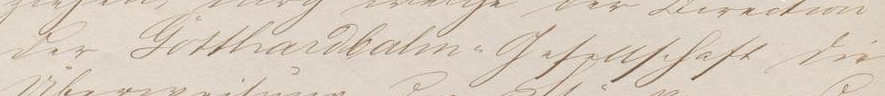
der Gotthardbahn-Gesellschaft die
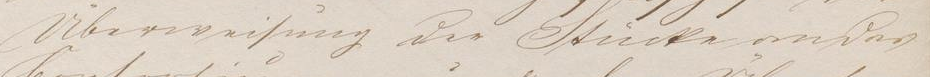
Überweisung der Stücke an das
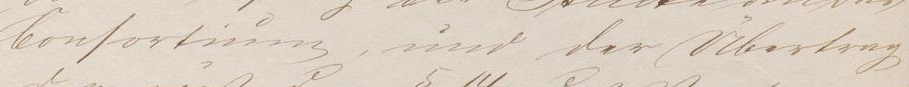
Consortium, und der Übertrag
